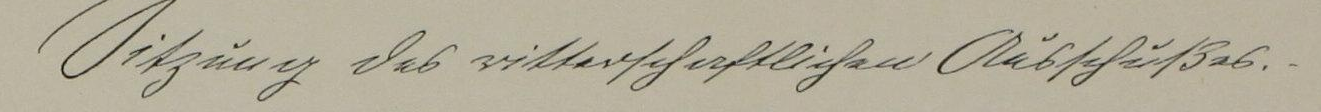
Sitzung des ritterschaftlichen Ausschußes.
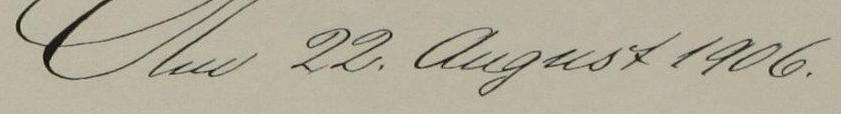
Am 22. August 1906.
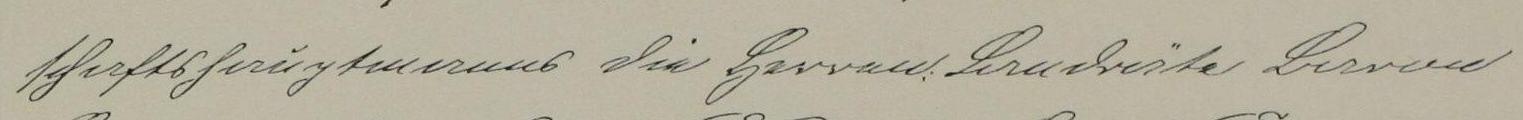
schaftshauptmanns die Herren Landräte Baron
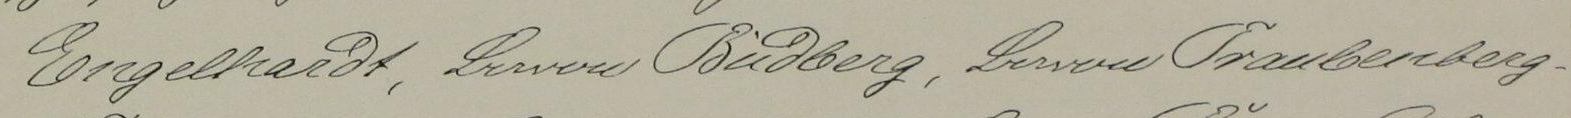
Engelhardt, Baron Budberg, Baron Traubenberg-
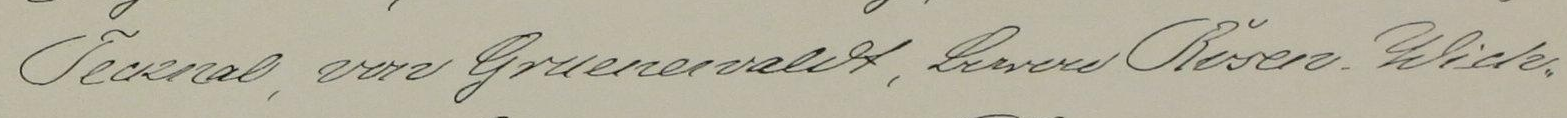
Tecknal, von Gruenewaldt, Baron Rosen-Wich-
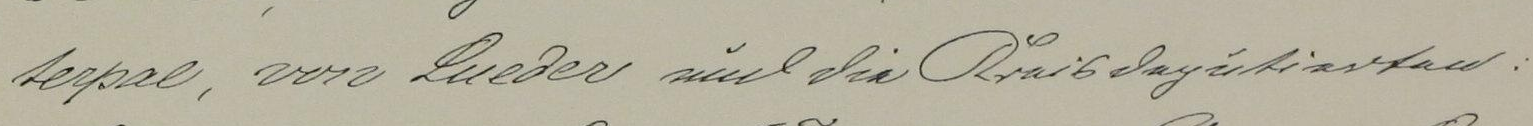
terpal, von Lueder und die Kreisdeputierten:
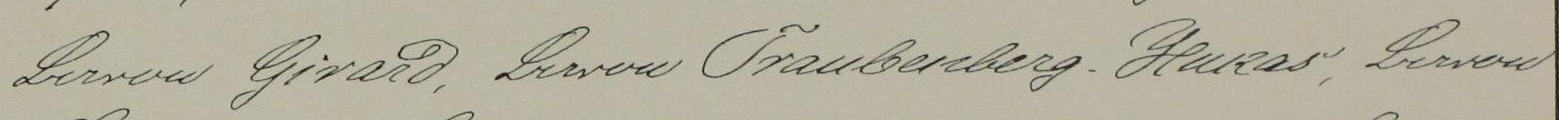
Baron Girard, Baron Traubenberg-Hukas, Baron
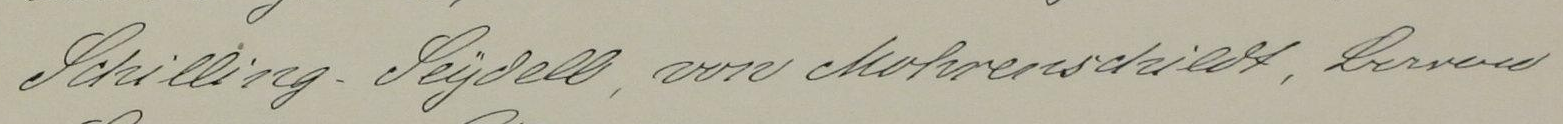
Schilling-Seydell, von Mohrenschildt, Baron
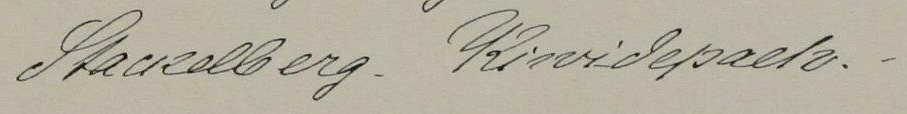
Stackelberg-Kiwidepaeh.
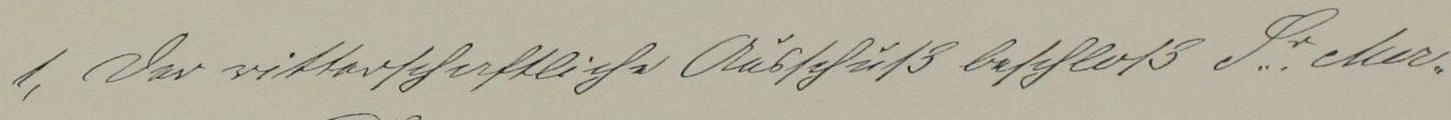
1. Der ritterschaftliche Ausschuß beschloß Sr. Ma-
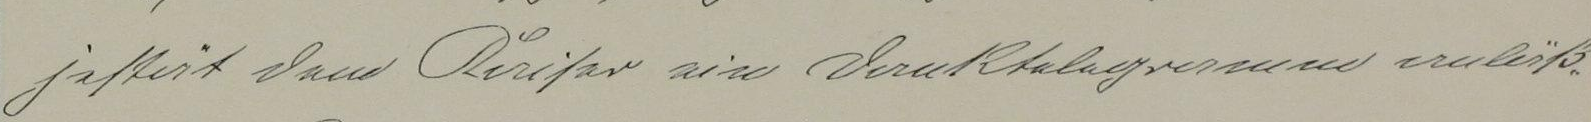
jestät dem Kaiser ein Danktelegramm anläß-
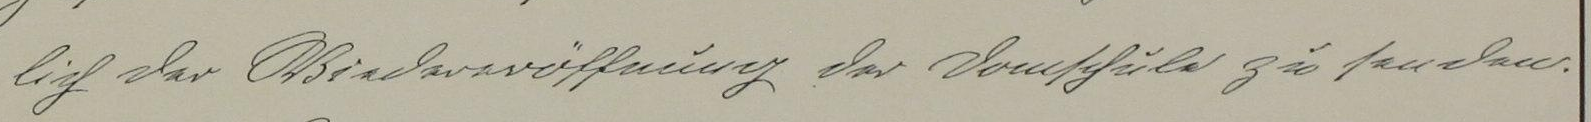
lich der Wiedereröffnung der Domschule zu senden.
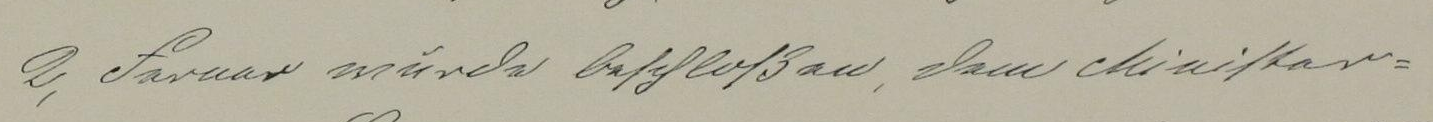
2. Ferner wurde beschloßen, dem Minister-
